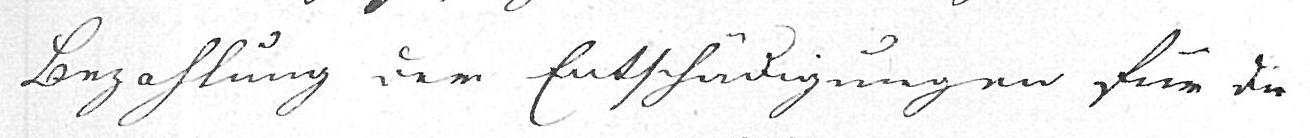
Bezahlung der Entschädigungen für die
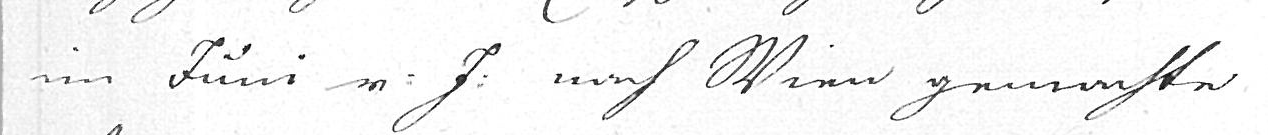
im Juni v:J: nach Wien gemachten
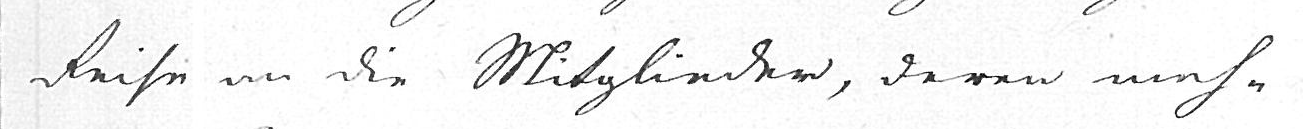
Reise an die Mitglieder, deren meh-
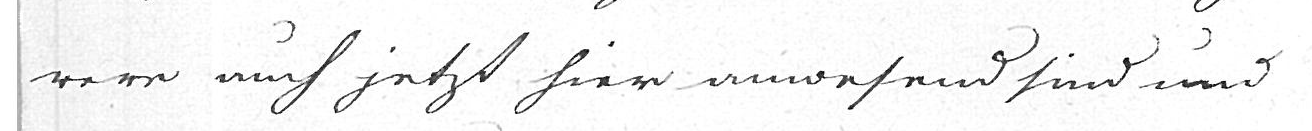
rere auch jetzt hier anwesend sind und
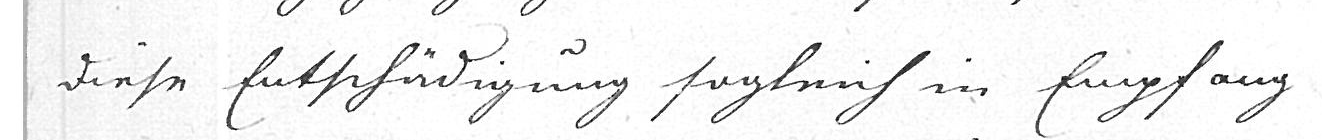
diese Entschädigung sogleich in Empfang
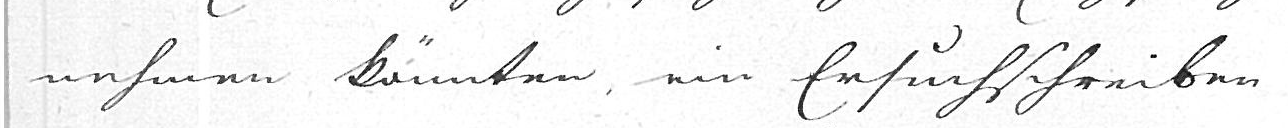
nehmen könnten, ein Ersuchschreiben
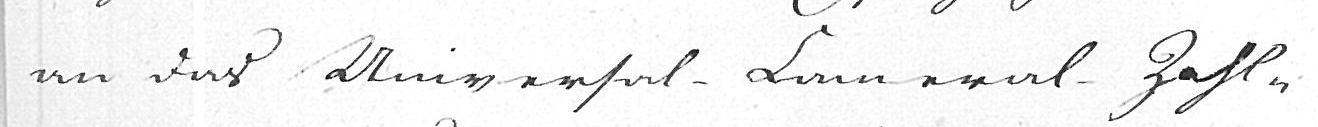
an das Universal-Cameral-Zahl-
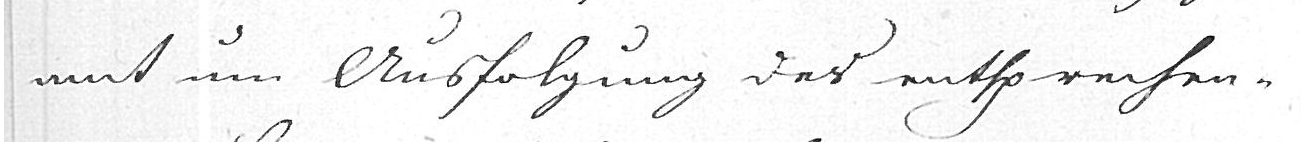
amt um Ausfolgung des entsprechen-
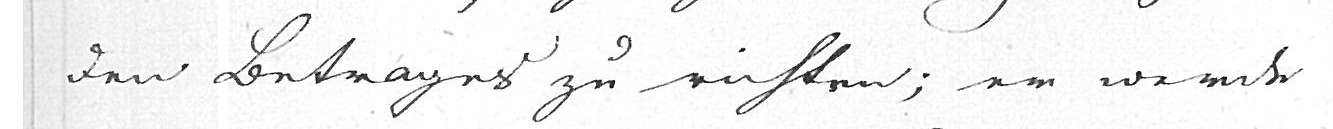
den Betrages zu richten; er werde
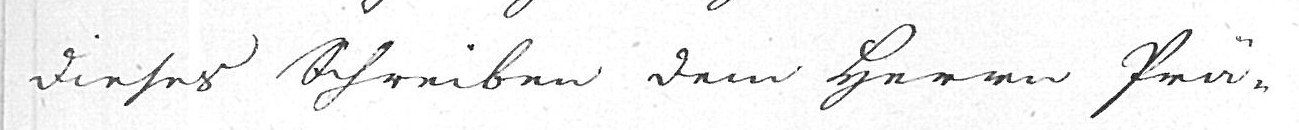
dieses Schreiben dem Herrn prä-
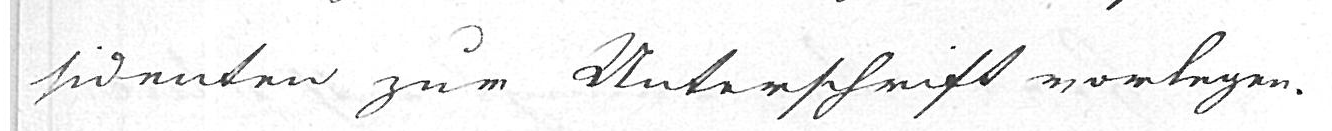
sidenten zur Unterschrift vorlegen.
